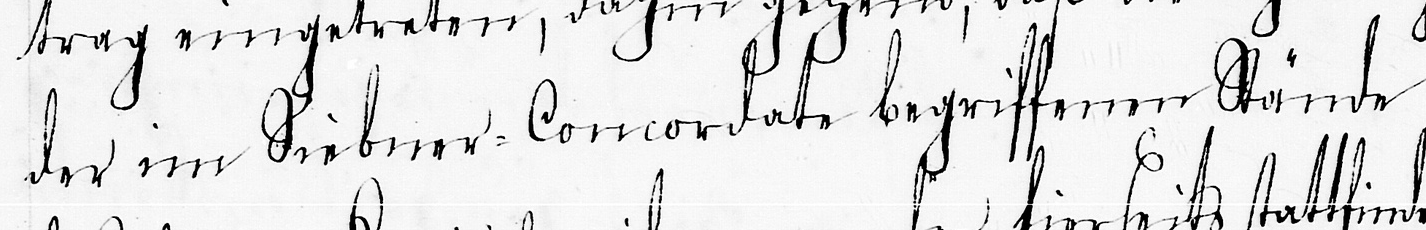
der im Siebner-Concordate begriffenen Stände
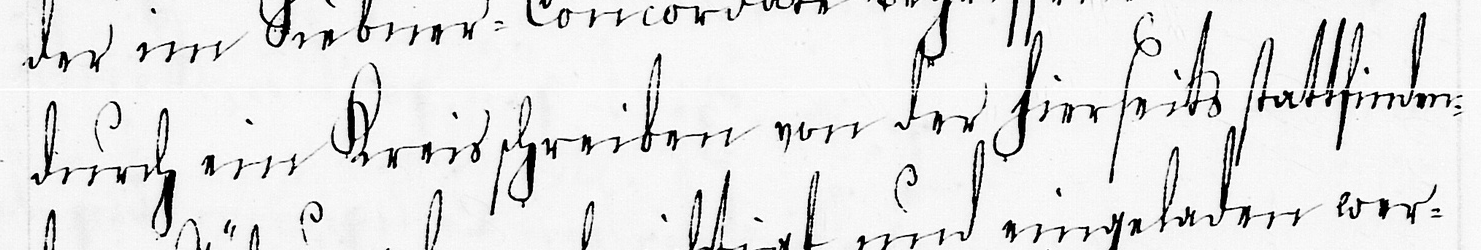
durch ein Kreisschreiben von der hierseits stattfind¬
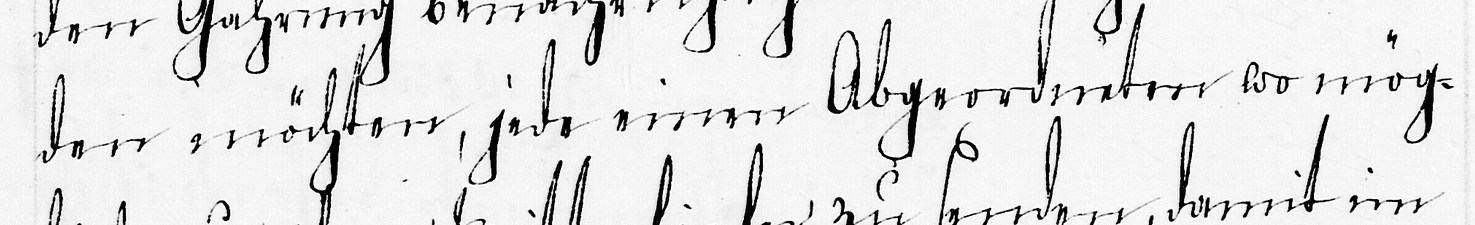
den möchten, jede einen Abgeordneten wo mög¬
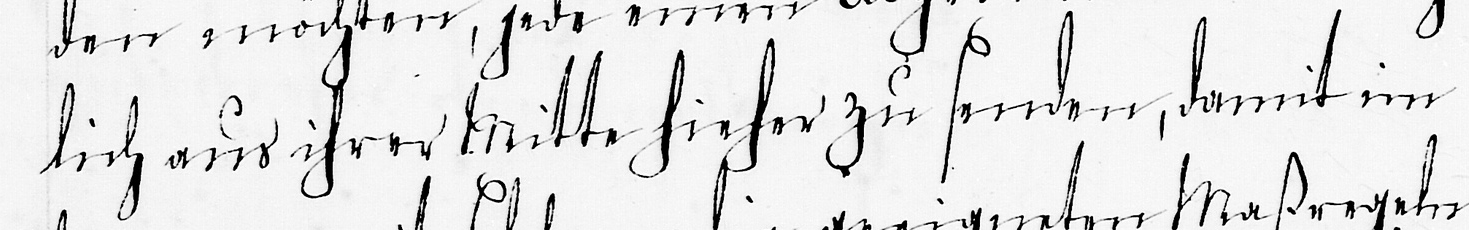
lich aus ihrer Mitte hieher zu senden, damit im
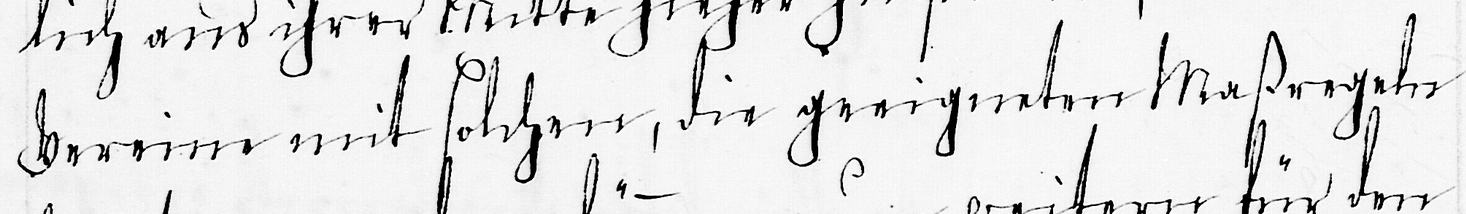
Vereine mit solchen, die geeigneten Maßregeln
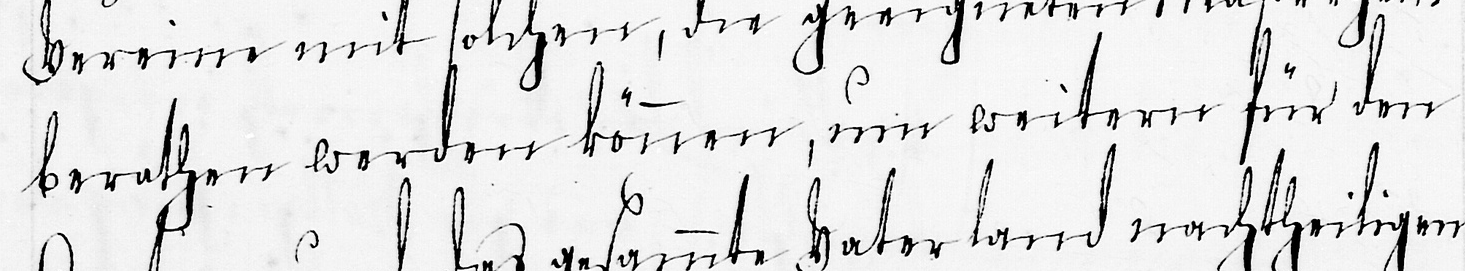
berathen werden können, um weitern für den
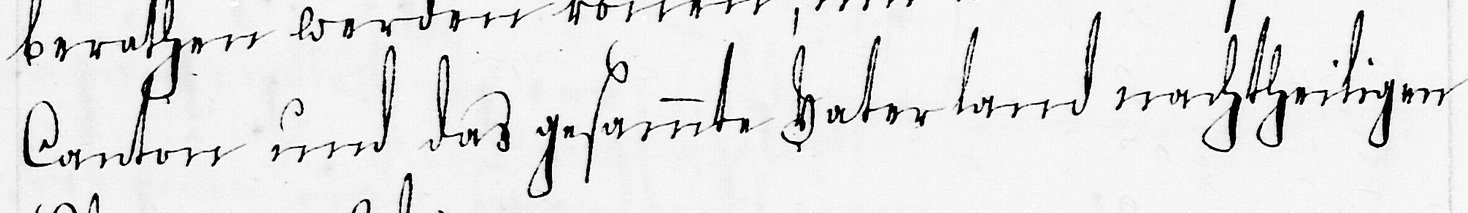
Canton und das gesammte Vaterland nachtheiligen
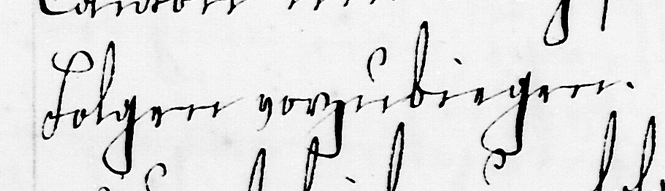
Folgen vorzubiegen.
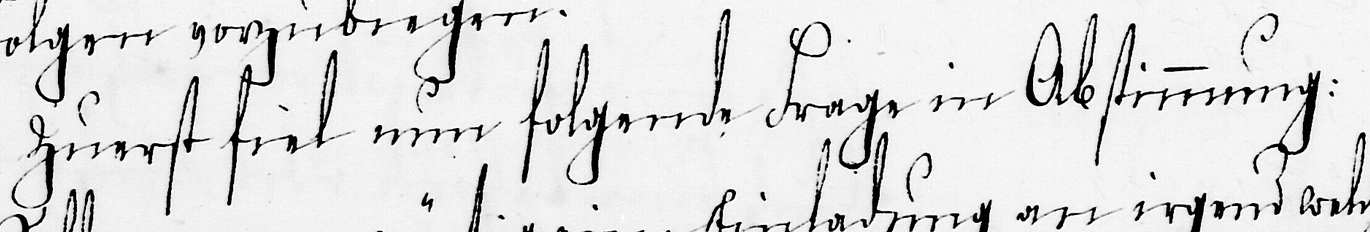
Zuerst fiel nun folgende Frage in Abstimmung:
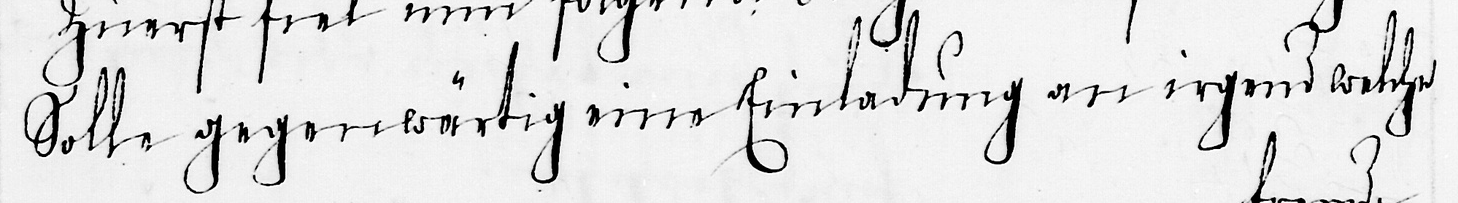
Solle gegenwärtig eine Einladung an irgendwelche
